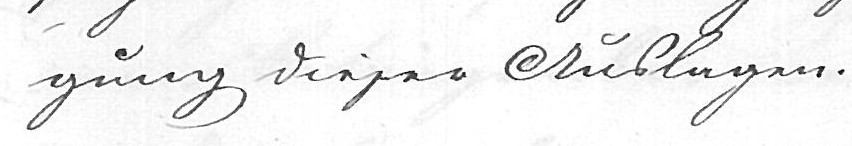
gung dieser Auslagen.
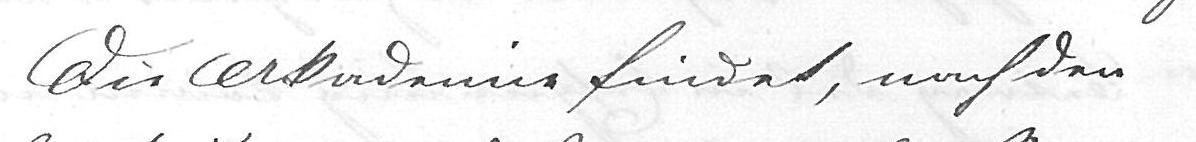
Die Akademie findet, nach den
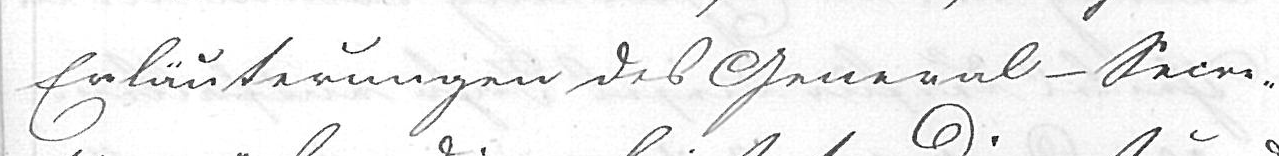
Erläuterungen des General-Secre-
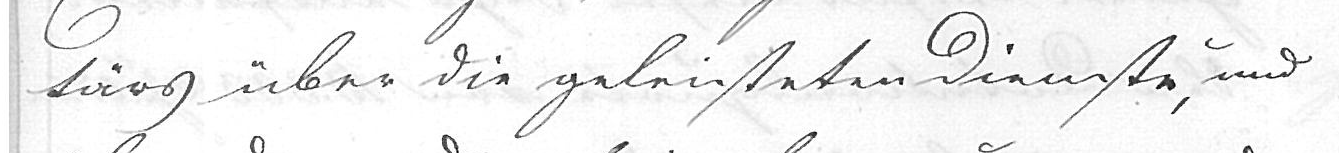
tärs über die geleisteten Dienste und
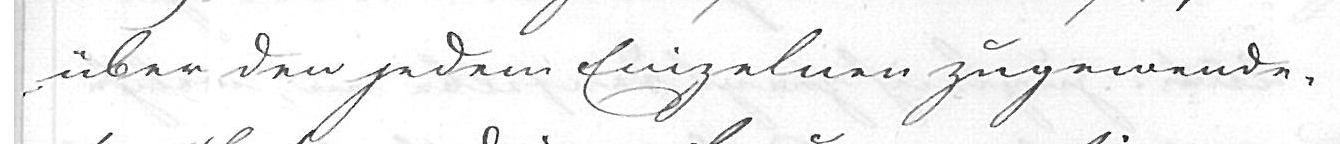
über den jedem Einzelnen zugewende-
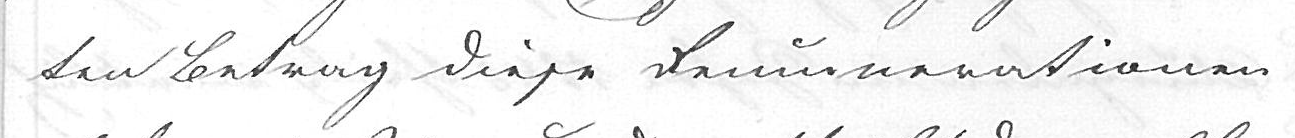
ten Betrag diese Remunerationen
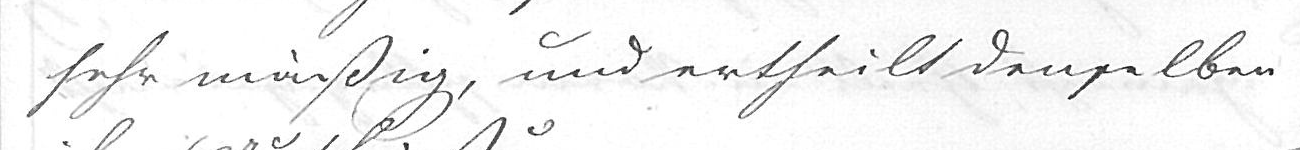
sehr mäßig und ertheilt denselben
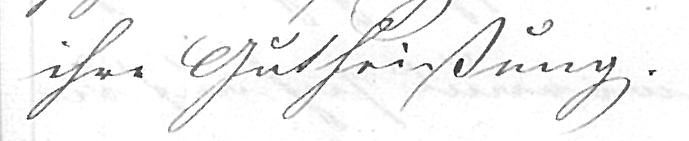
ihre Gutheißung.
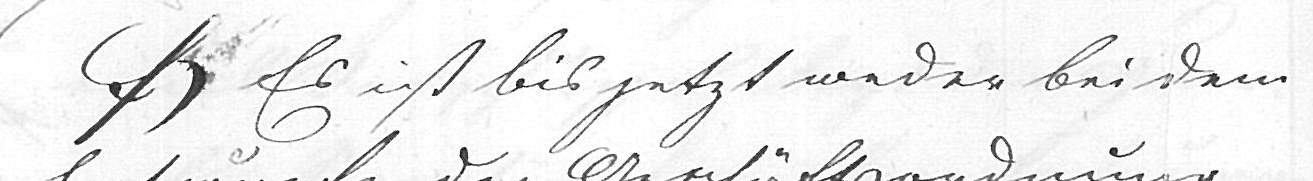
f) Es ist bis jetzt weder bei dem
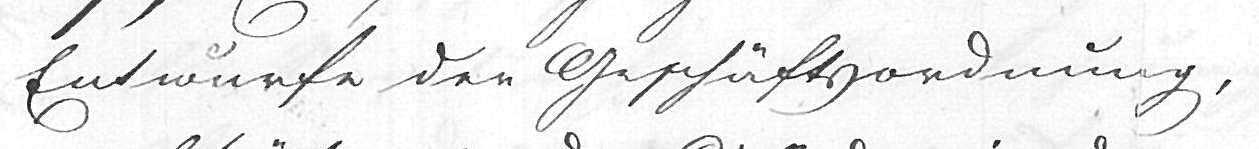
Entwurfe der Geschäftsordnung,
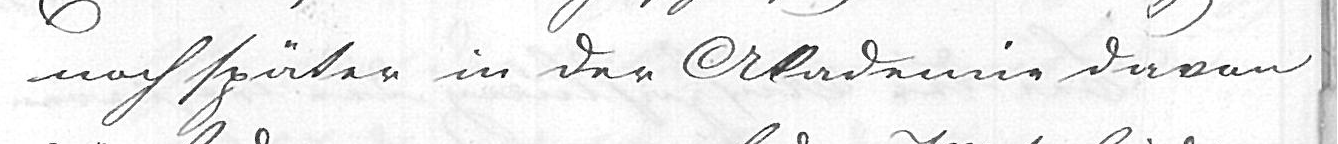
noch später in der Akademie davon
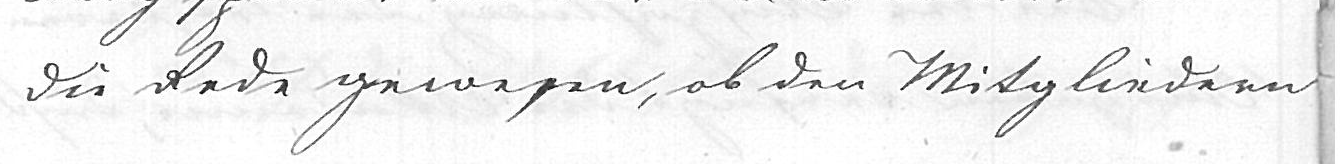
die Rede gewesen, ob den Mitgliedern
